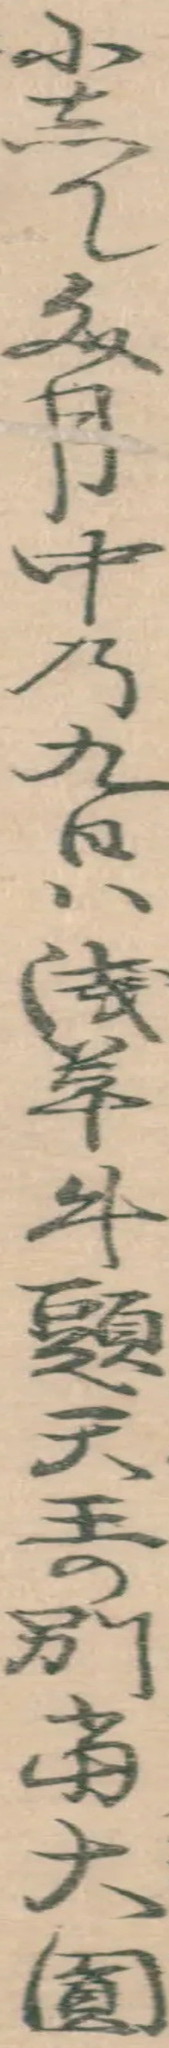にして文月中の九日は浅草牛頭天王の別当大円
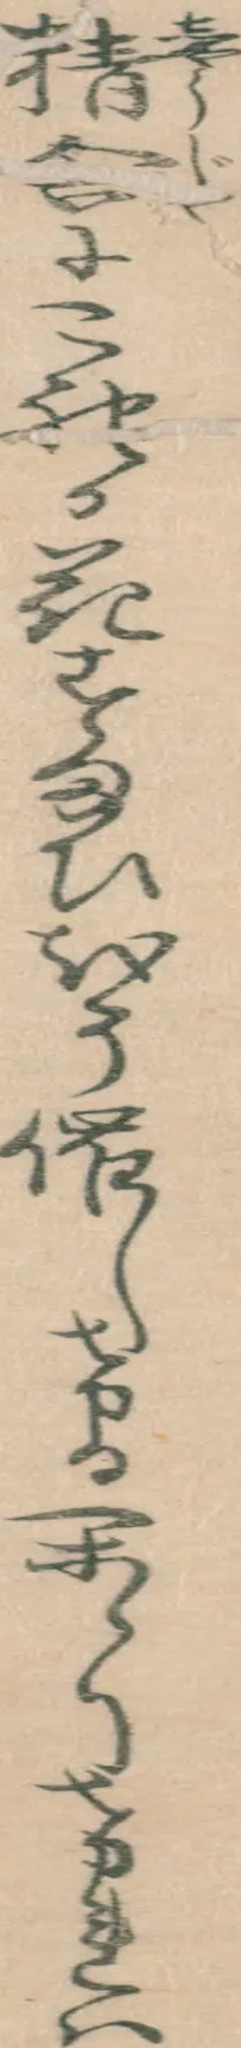精舎にこれか花すまひをそ催しけるかゝりけれは
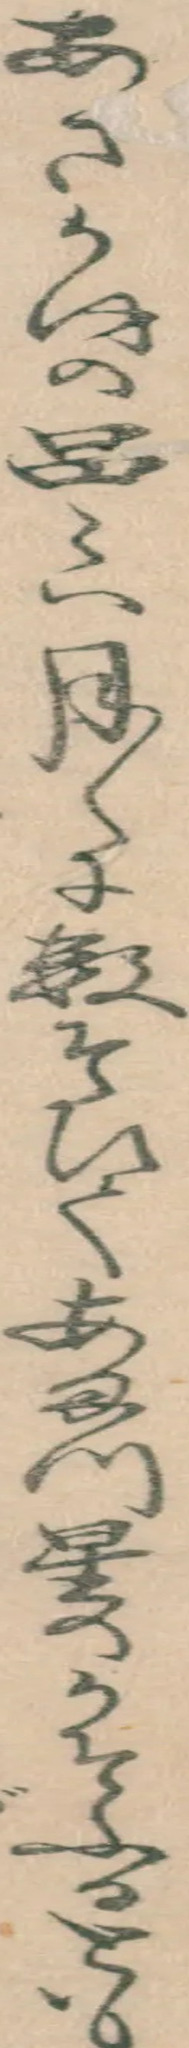あさかほの品々は月〳〵に数そひてあまつ星のかそふるとも
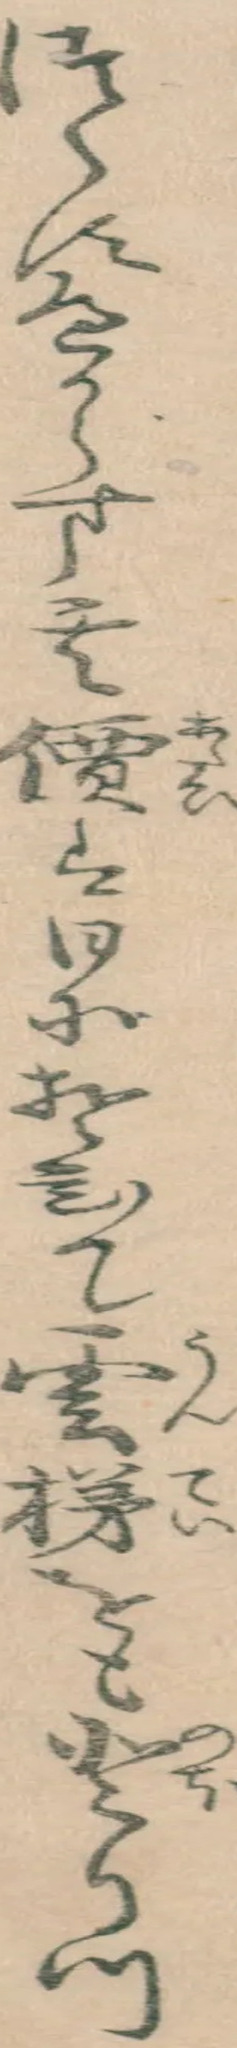つくすへからす其価は日にそひて雲梯をも登りつ
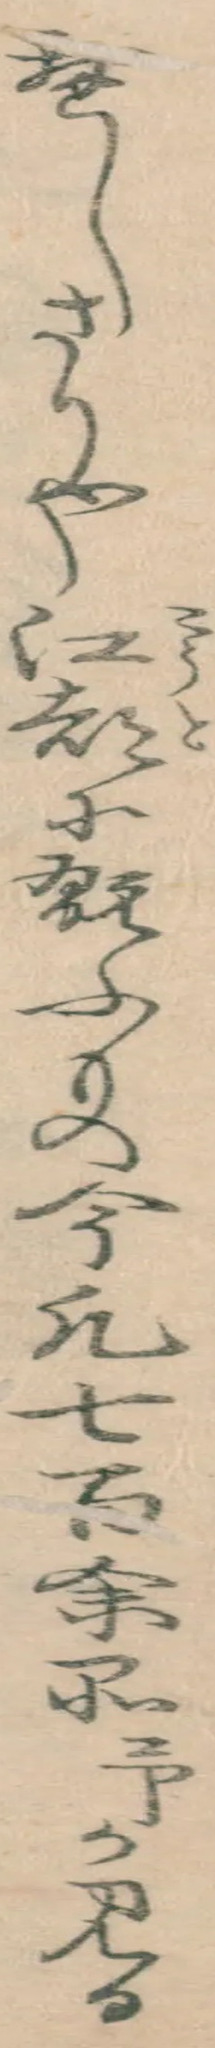へしさりや江都に翫ふもの今凡七百余品予か見る
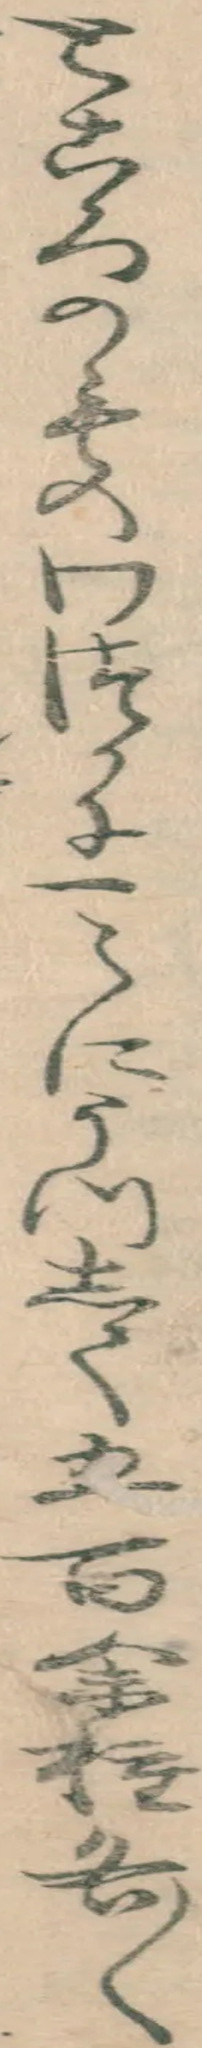ところのものわつかにこゝにうつして五百余種各〳〵
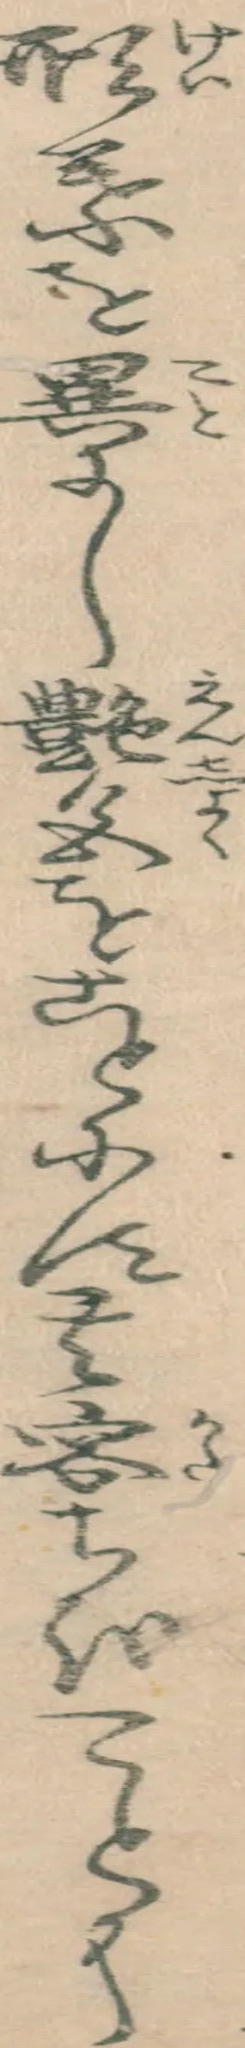形葉を異にし艶色をことにす其容ちをことに
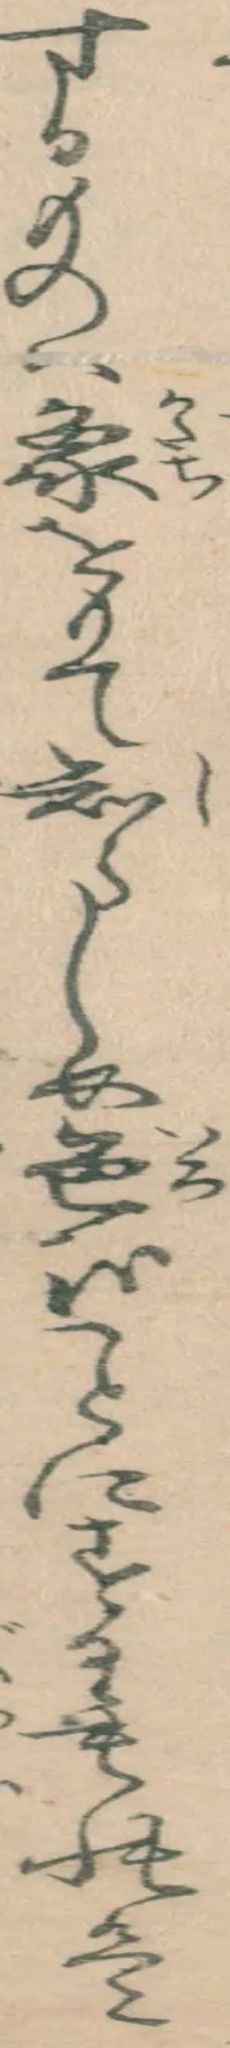するものは象をもて知らしめ色をことにするものは
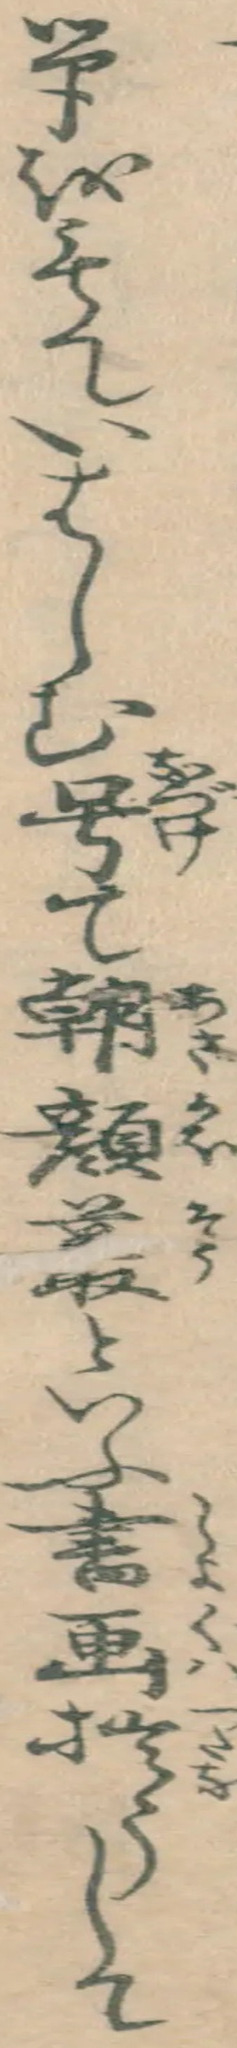筆をもていはしむ号て朝顔叢といふ書画拙うして

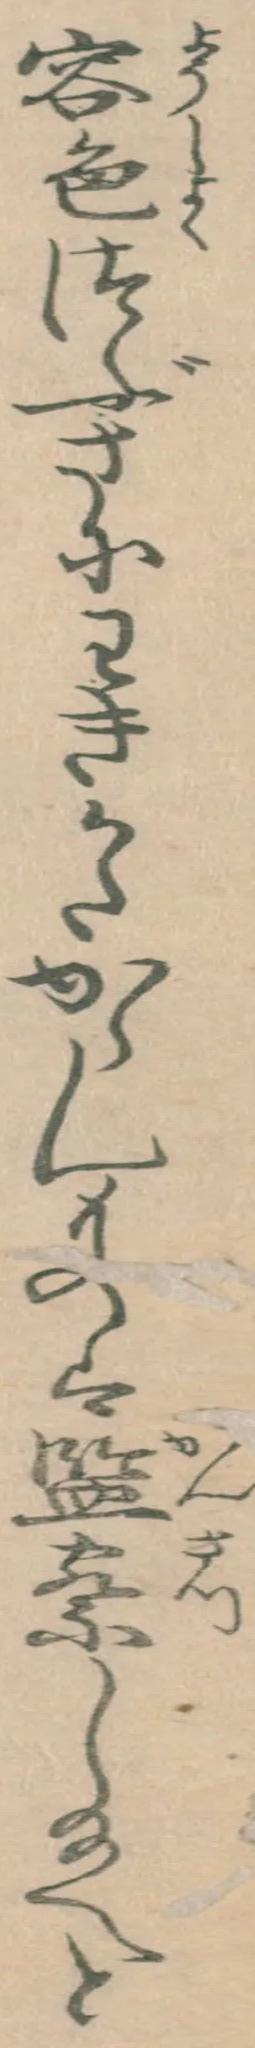容色つぶさにわきかたからんものは監察し給へと
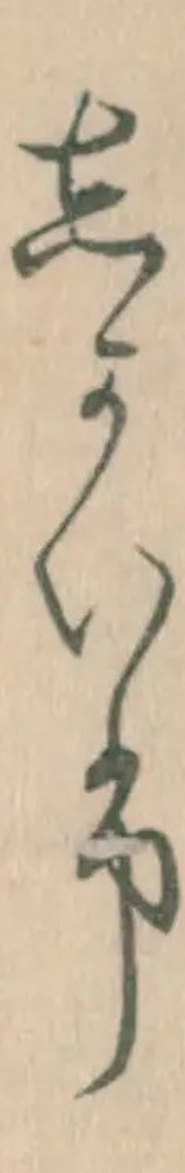しかいふ
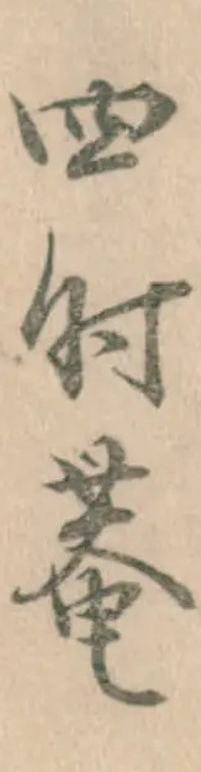四時庵
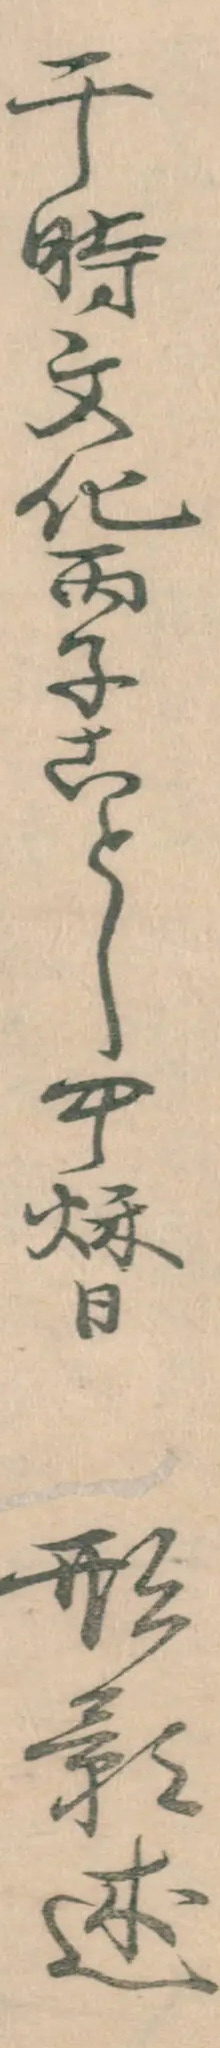于時文化丙子ことし中秋日形影述
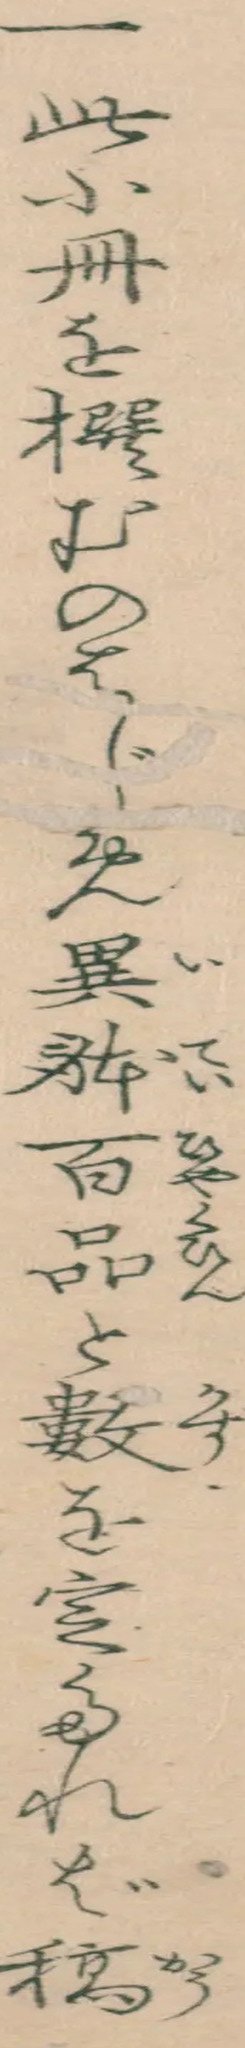一此小冊を撰むのはじめ異体百品と数を定たれば稿
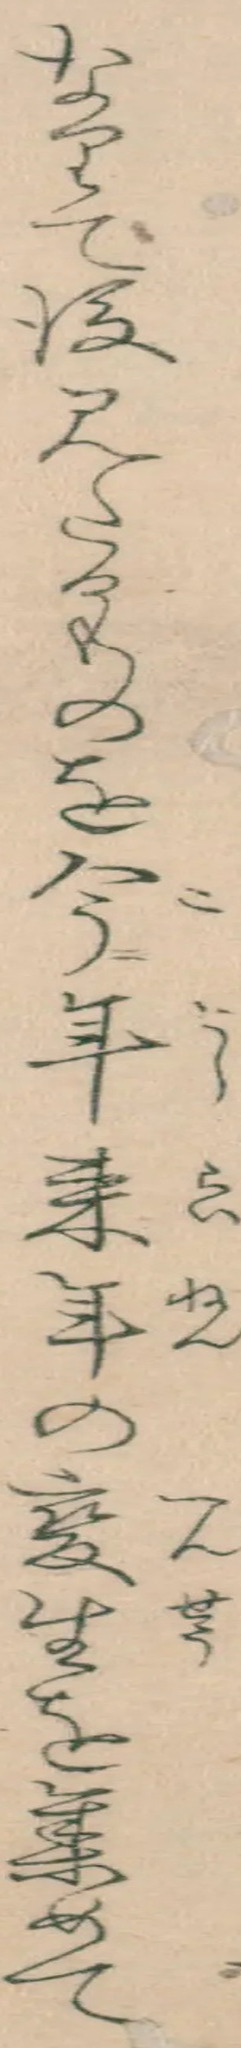なりて後見たるものを今年来年の変生を集めて
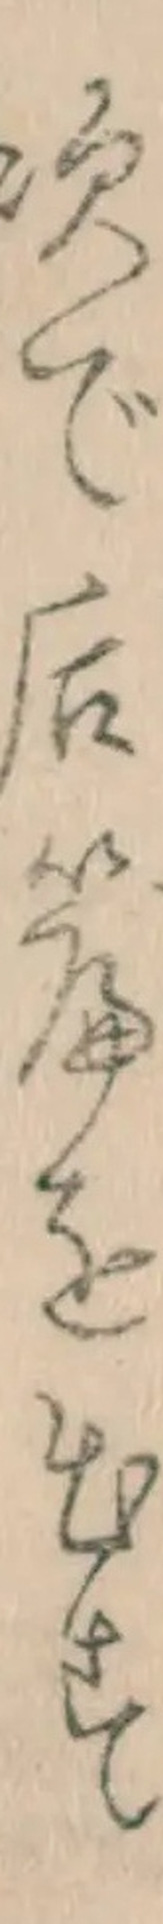次で后篇を出す
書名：朝顔叢. 上巻
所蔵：国立国会図書館 National Diet Library, JAPAN
